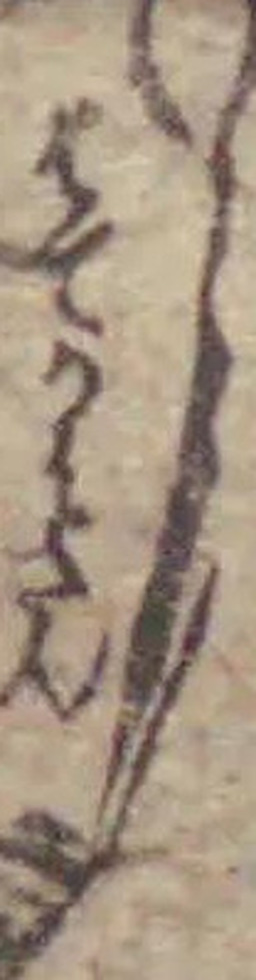はてかみさん
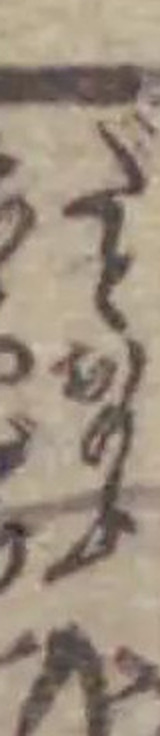だとおもふ
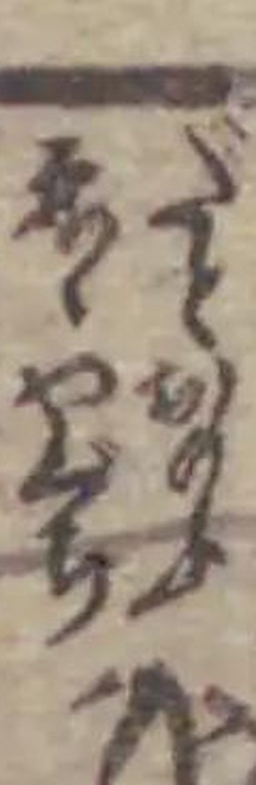ゑゝやぐち
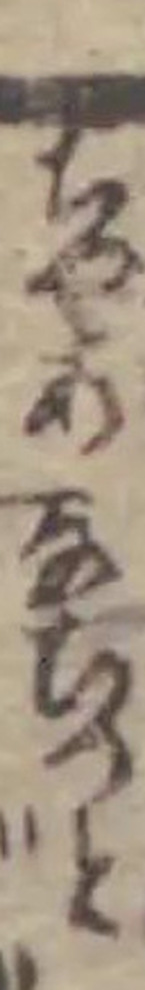ちやあなちつと
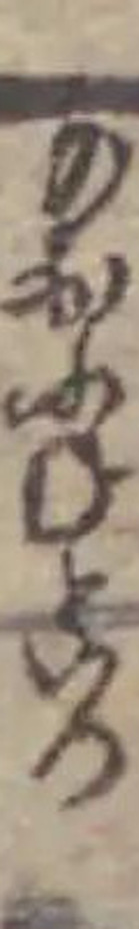のおふねといつ
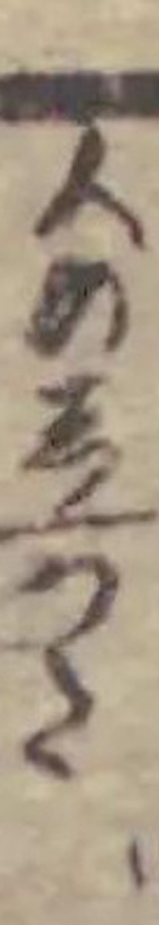人のしつた
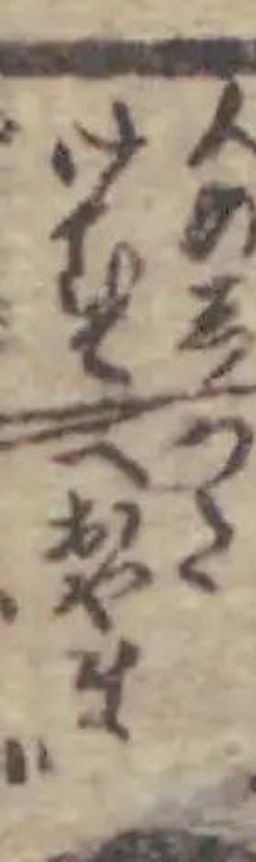けむてへおやま
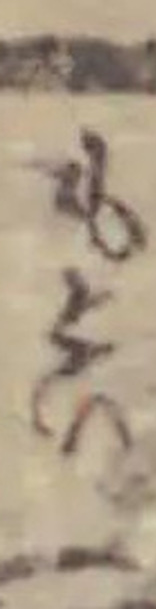もとい
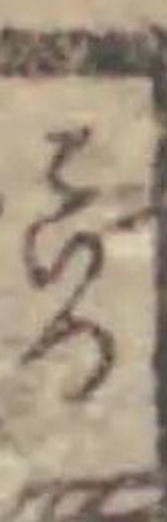こいつ
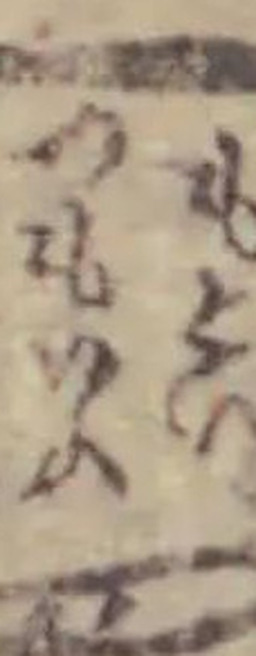つもいふ
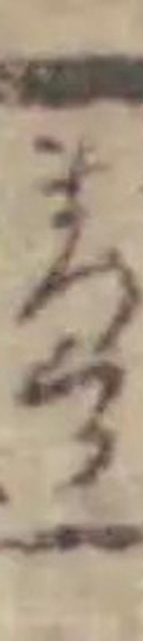まつくら
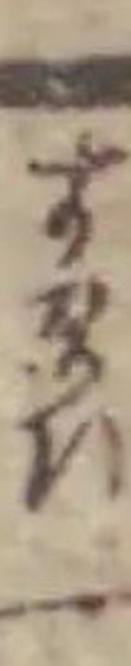すまは
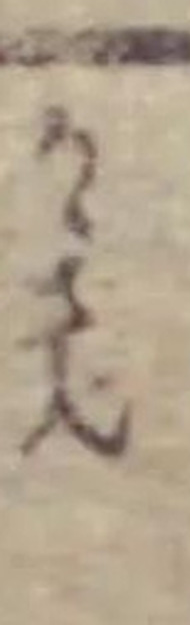かゝさん
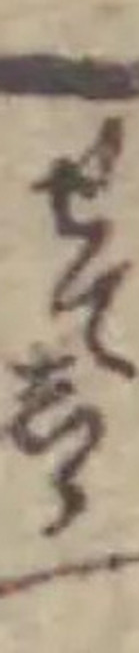せてしら
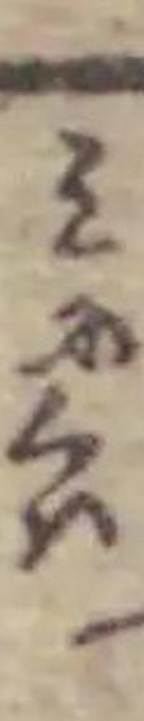みにくは
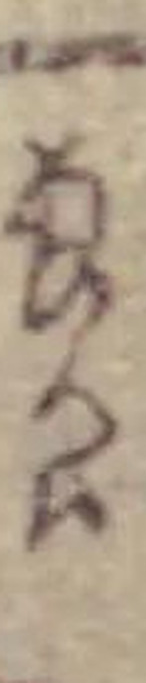あいつは
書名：飛た間違矢口噂 2巻
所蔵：国立国会図書館 National Diet Library, JAPAN
